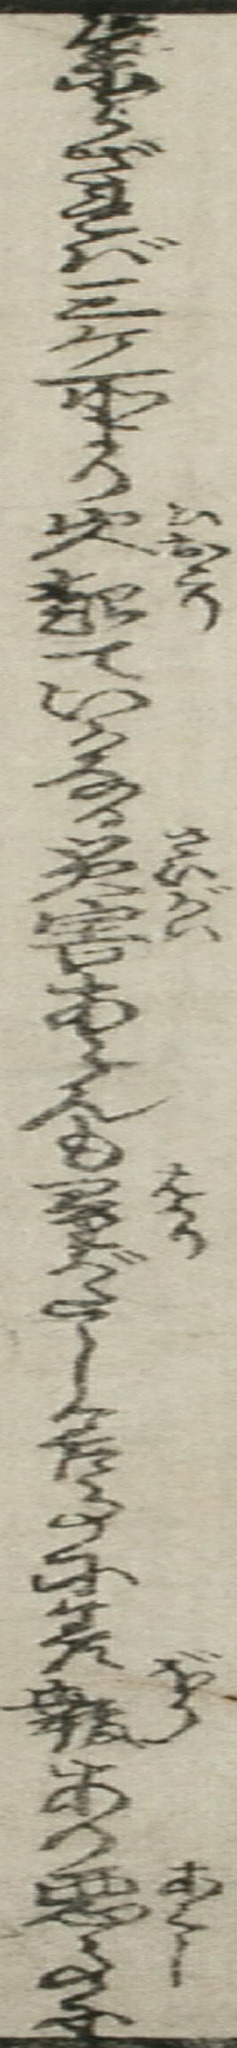参らざれば三ヶ所より火起ていかなる災害あらんも量がたし善事に善報あり悪事に
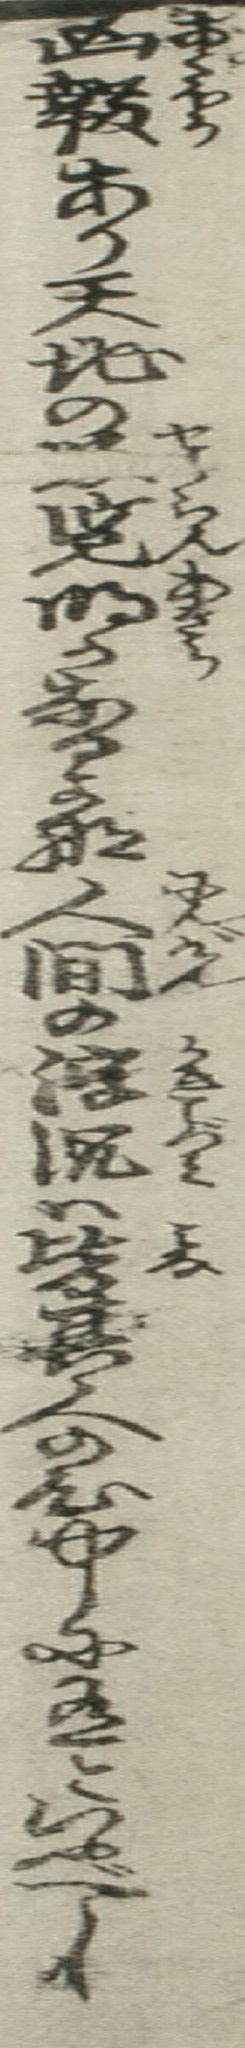凶報あり天地の照覧明かなるかな人間の浮沈は皆其人の心中に有といふべし
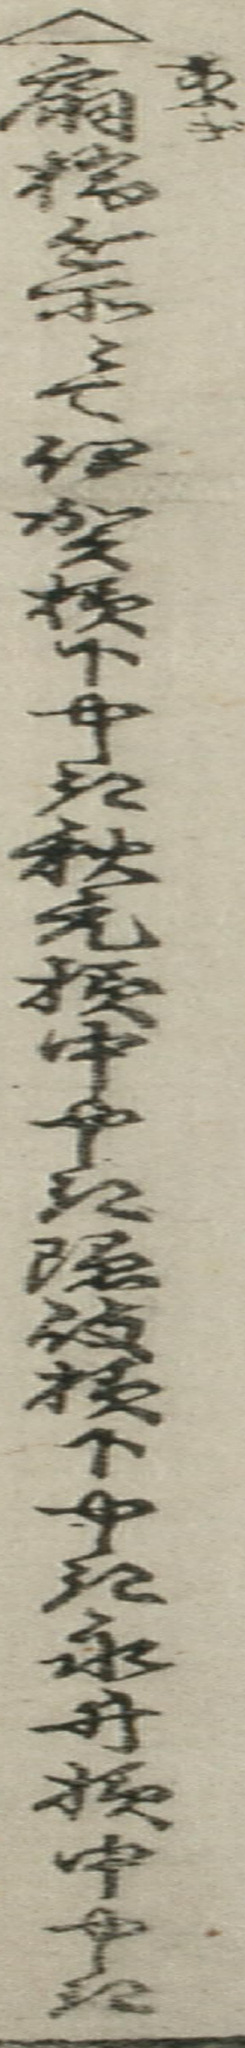△扇橋近所にて伊賀様下やしき秋元様中やしき隠岐様下やしき永井様中やしき
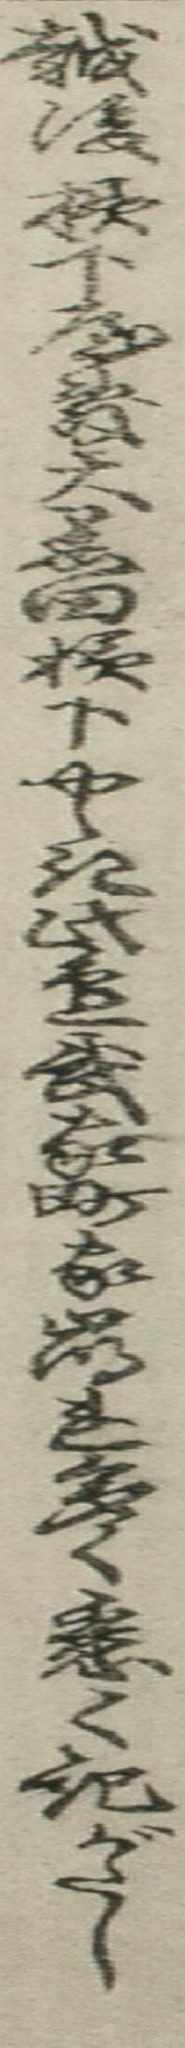越後様下屋敷大黒田様下やしき此辺武家町家崩れ多く悉く記がたし
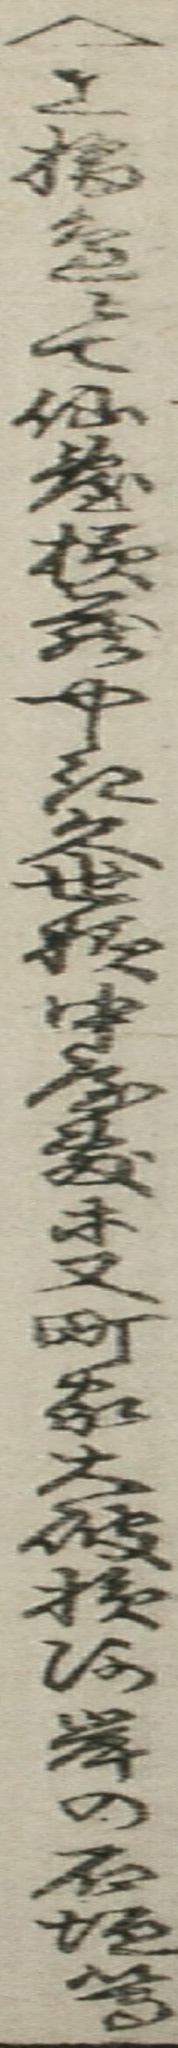△上橋辺にて仙臺様蔵やしき久世様中屋敷等又町家大破損河岸の石垣等
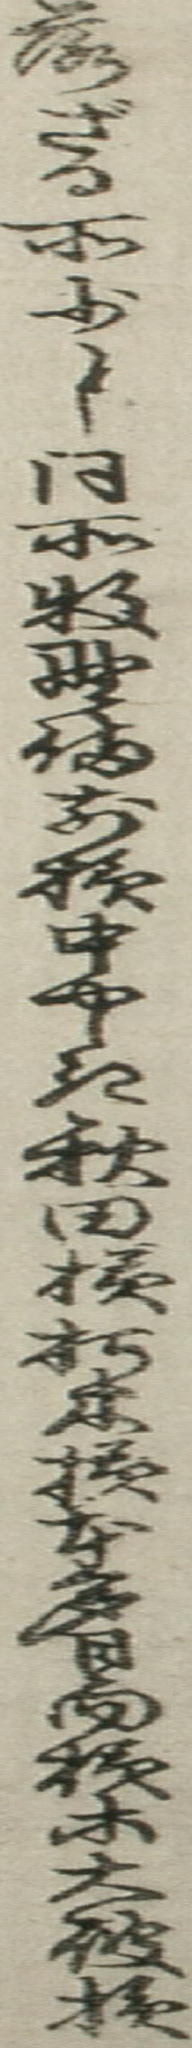落ざる所少し同所牧野備前様中やしき秋田様朽木様本多日向様等大破損
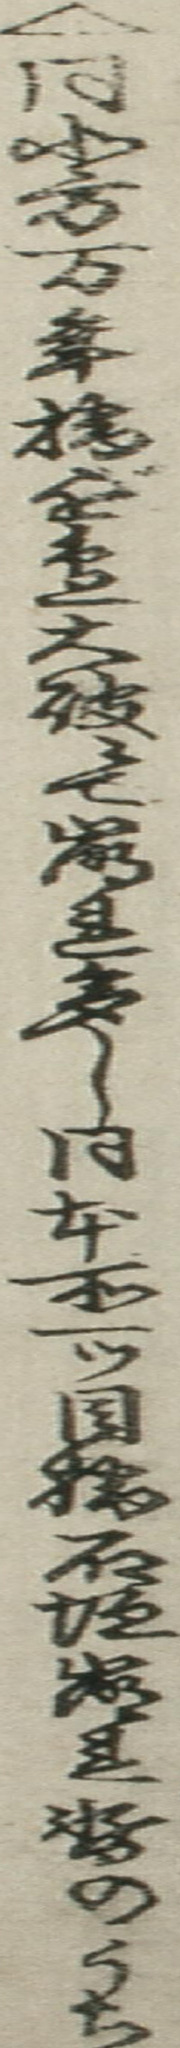△同北方万年橋近辺大破損にて崩れ多し同本所一ツ目橋石垣崩れ暫のうち
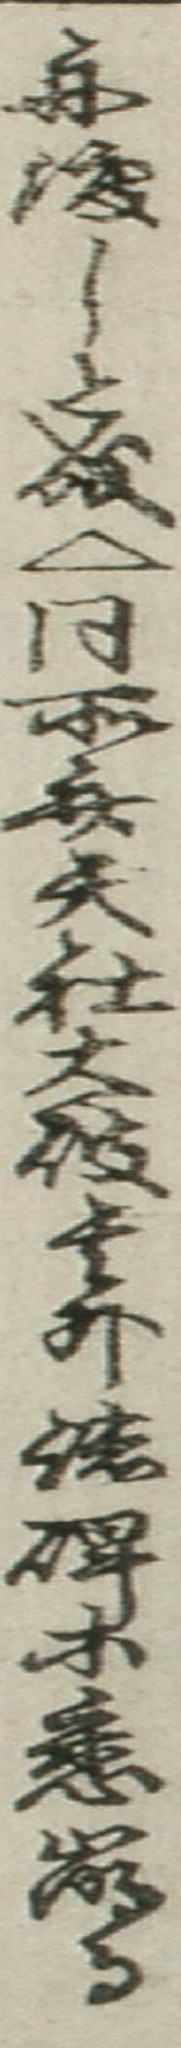舟渡しと成△同所弁天社大破其外諸碑等悉崩る
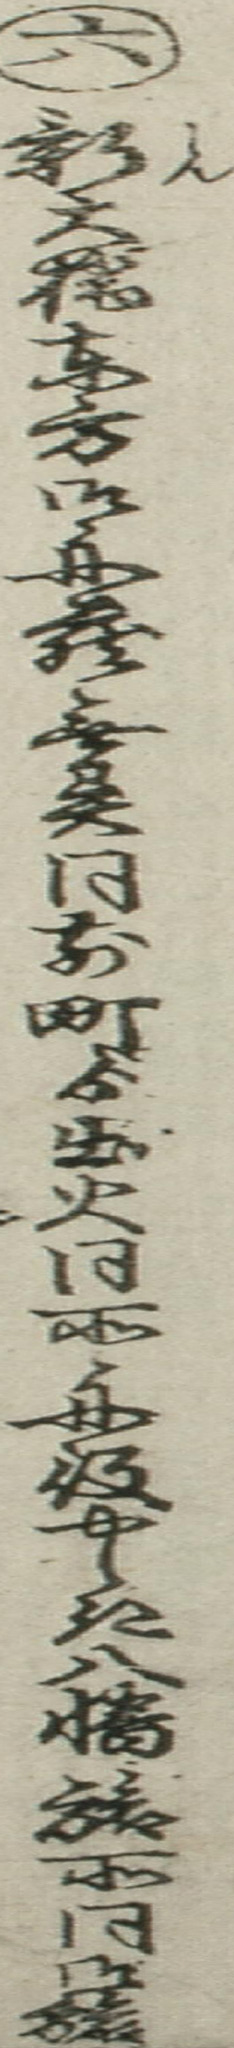新大橋東方御舟蔵無異同前町ゟ出火同所舟役やしき八幡旅所同御旅
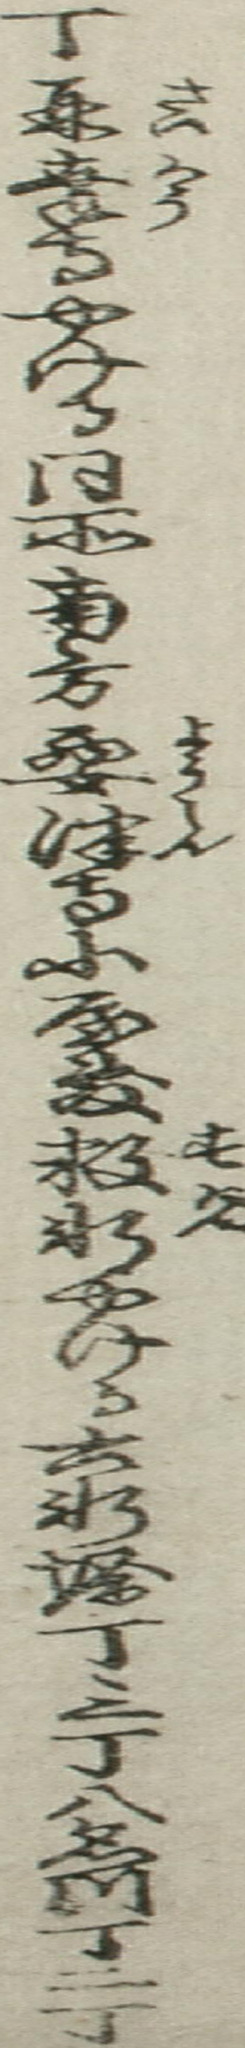丁再幸寺やける同所南方要津寺小屋敷数軒やける六軒堀丁三丁八名川丁二丁
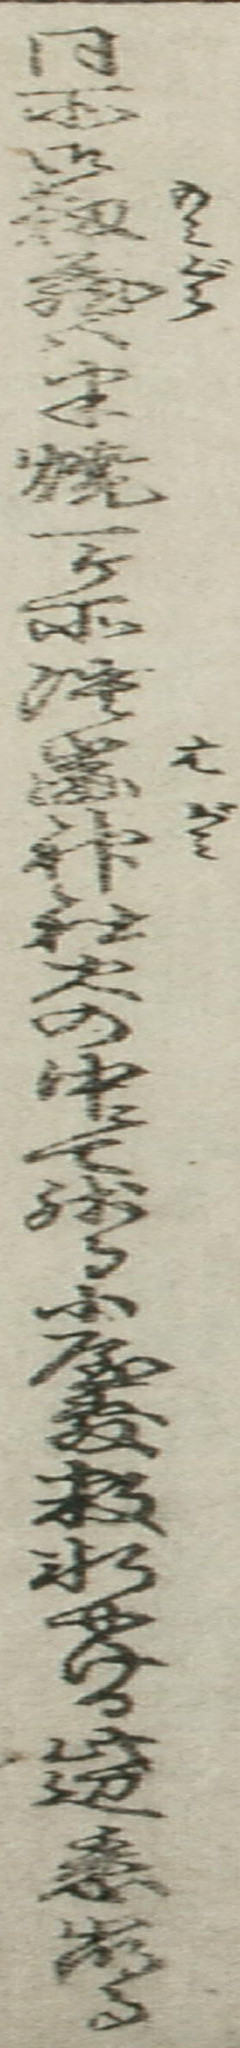同所御籾蔵は半焼一ヶ所潰歯神社火の中にて残る小屋敷数軒やける此辺悉崩る
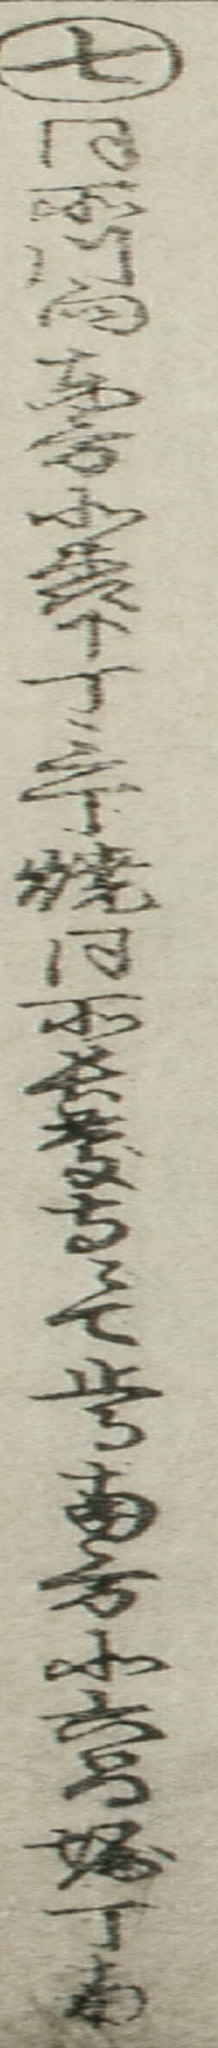同所川向東方北森下丁三丁焼同所長慶寺にて止る南方北六間堀丁南
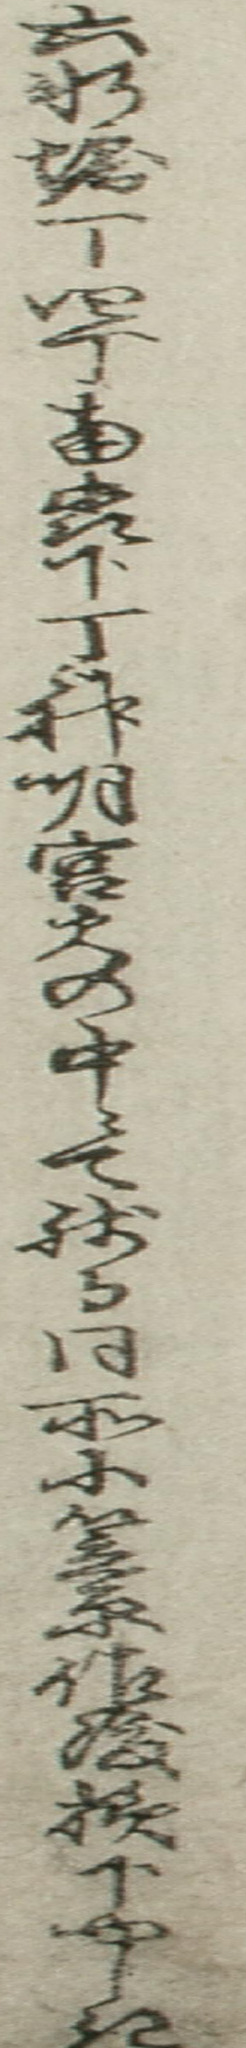六軒堀丁四丁南森下丁神明宮火の中にて残る同所小笠原佐渡様下やしき
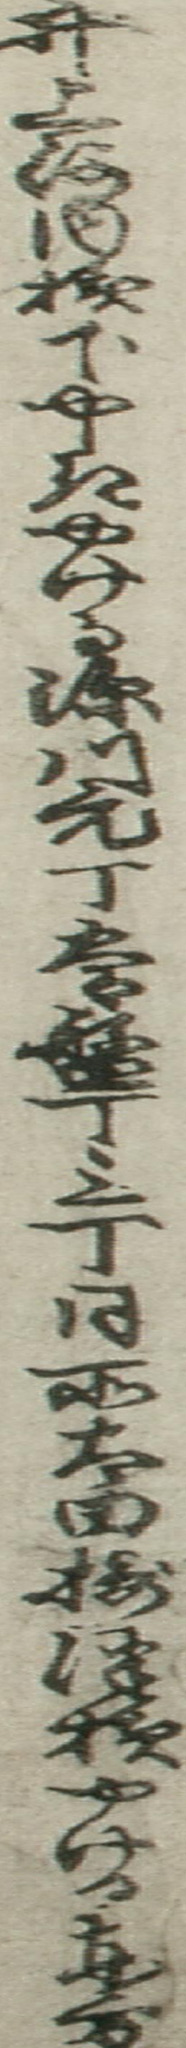井上河内様下やしきやける深川元丁常盤丁三丁同所太田摂津様やける東方

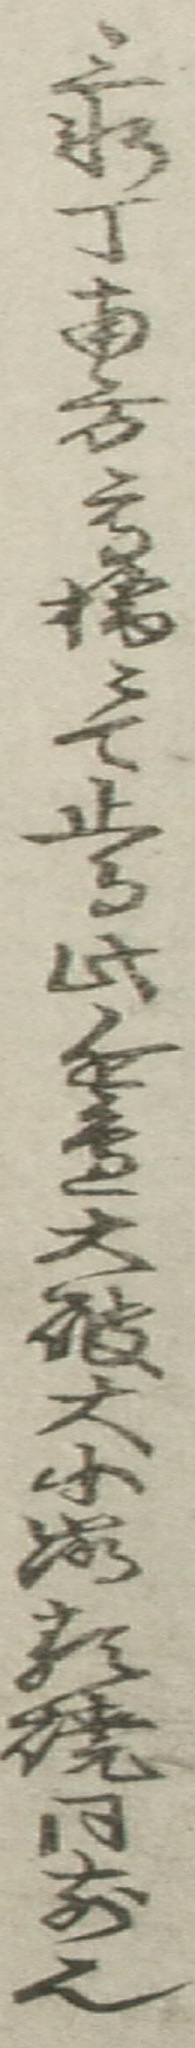三軒丁南方高橋にて止る此近辺大破大小崩類焼同前也
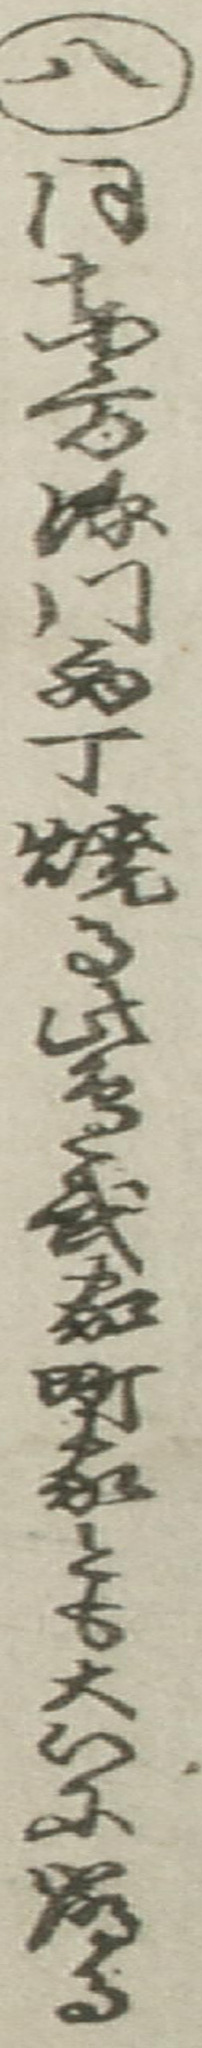同東方深川西丁焼る此辺武家町家とも大いに崩る
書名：安政見聞誌　上
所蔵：東京大学地震研究所図書室 Earthquake Research Institute Library, The University of Tokyo, JAPAN
